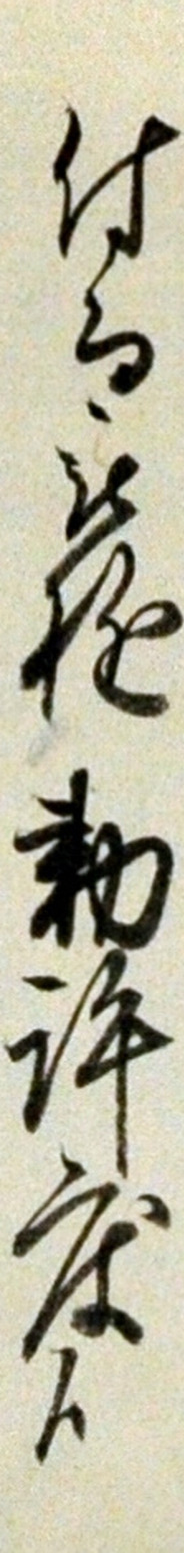付て被遊勅許度候
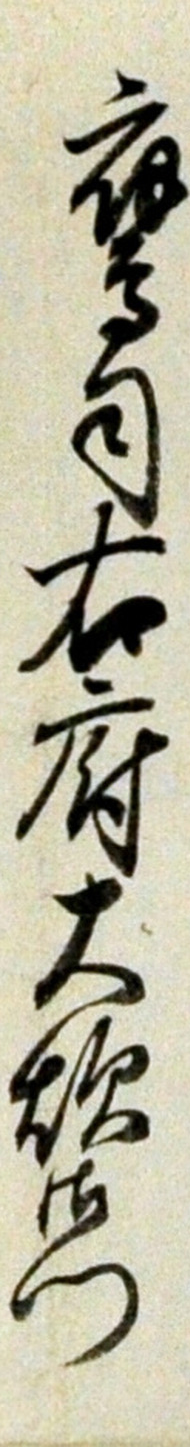鷹司右府大炊御門
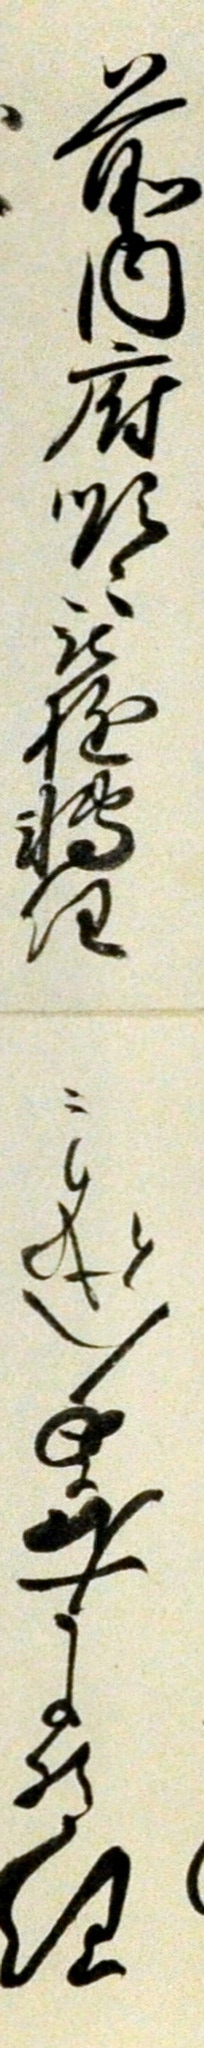前内府順々被遊転任
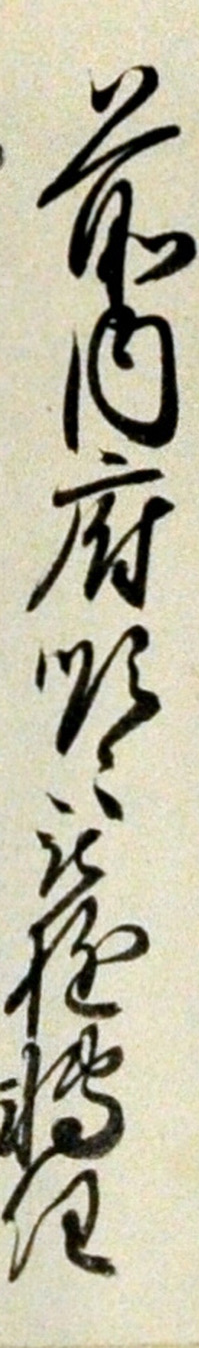前内府順々被遊転任
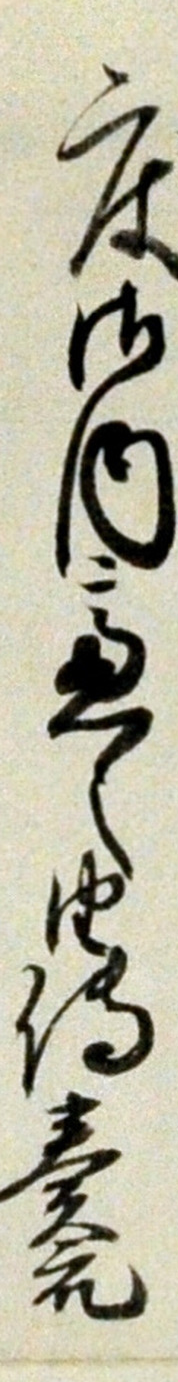度御内慮之由伝奏衆
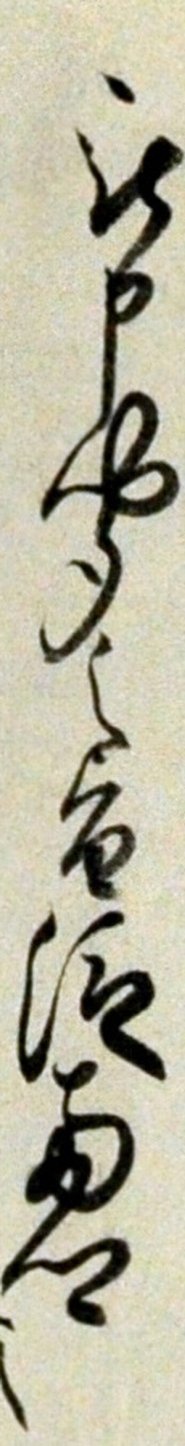被申聞之旨従両卿之
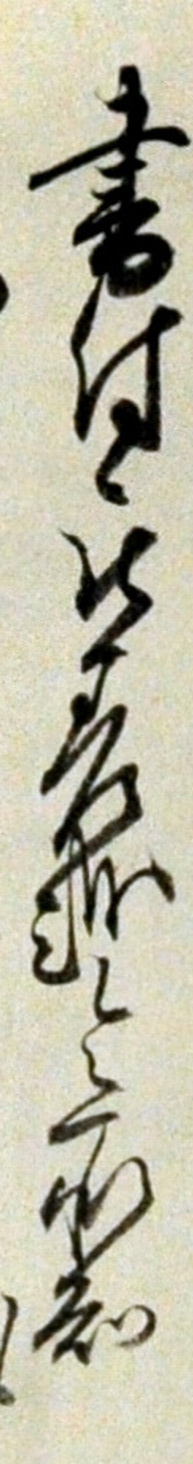書付被差越令承知候
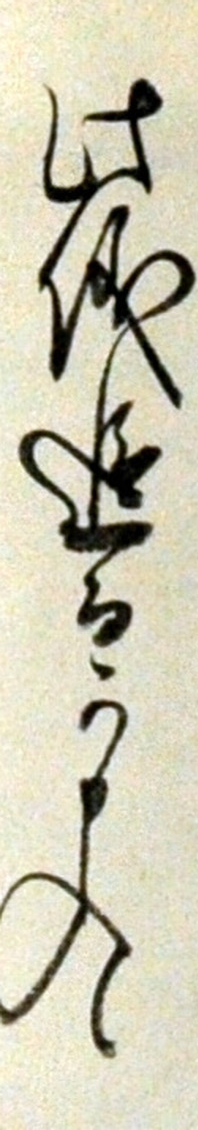此儀追て可申入候

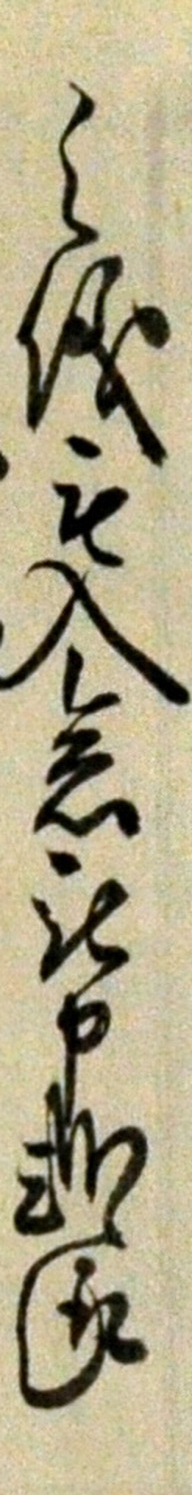之儀被入念被申越候趣
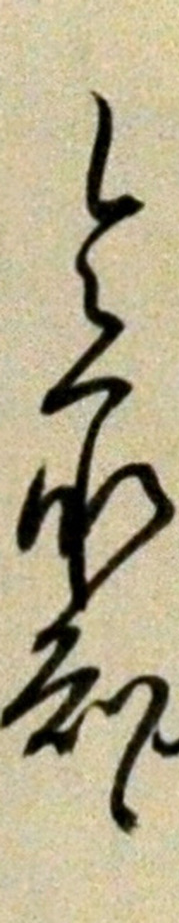令承知候
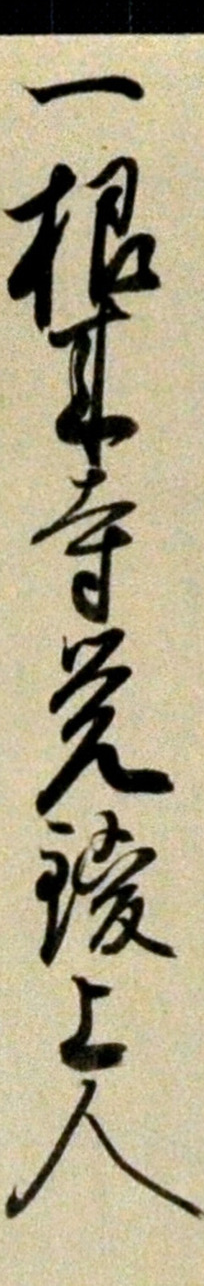一根来寺覚鑁上人
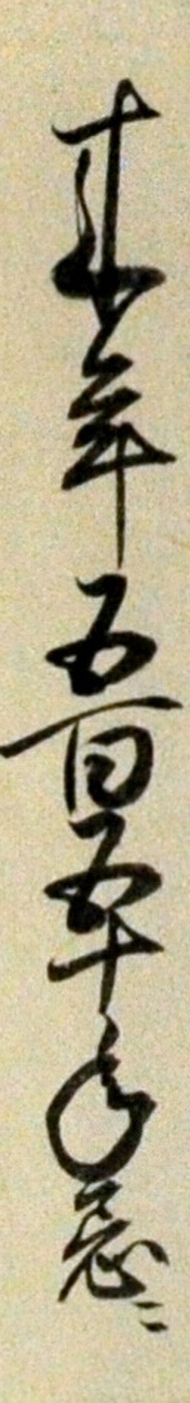来年五百五十年忌に
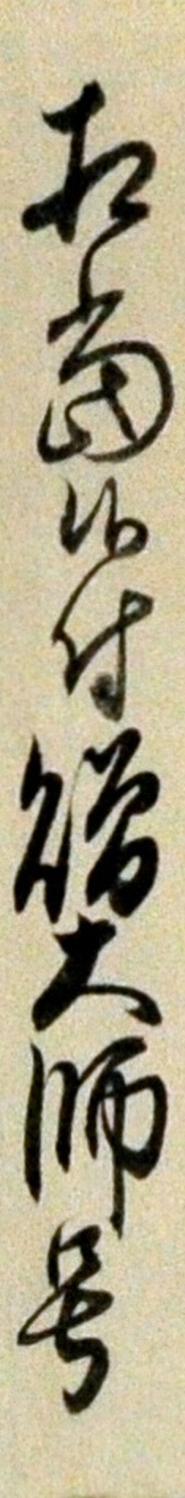相当候付贈大師号
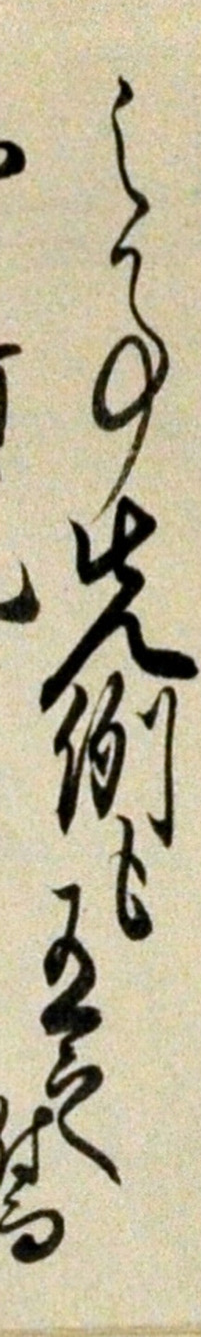之事先例も有之付て
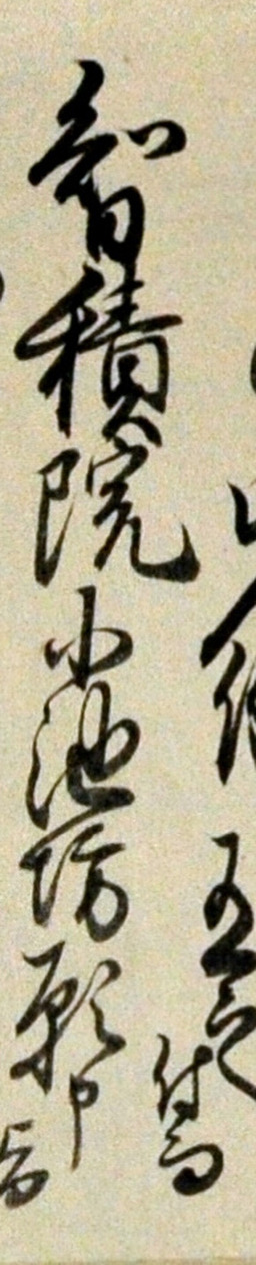智積院小池坊願申旨
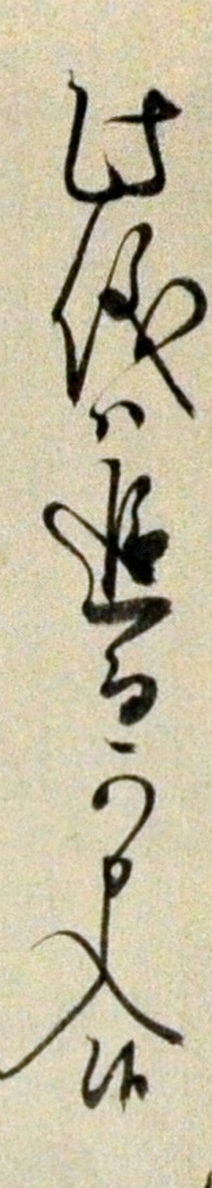此儀は追て可申入候
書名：書状
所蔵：伊那市立高遠町図書館・合同会社AMANE
